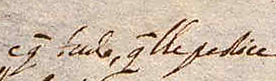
e q̄ tudo, q̄ lhe pedice
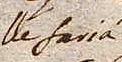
lhe faria
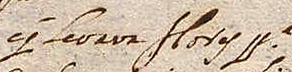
e q̄ levava flores p.a
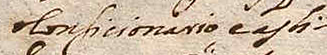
o Conficionario, e as ti
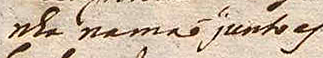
nha na maõ junto as
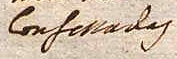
Confessadas
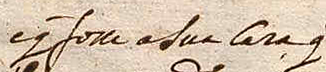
e q̄ fosse a sua caza q̄
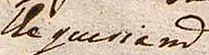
lhe queria mto.
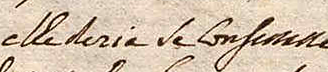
elle dezia se confessasse
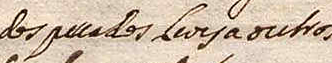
dos peccados leves a outros
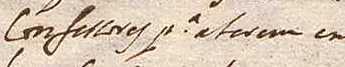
Confessores pa. a terem em
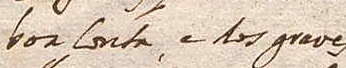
boa Conta, e dos graves
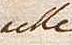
a elle
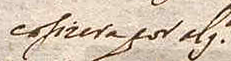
e o fizera por alg.as
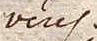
vezes.
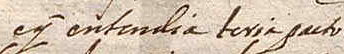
e q̄ entendia teria pacto
